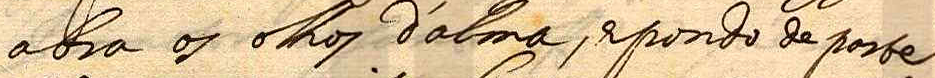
abra os olhos d'alma, E pondo de parte
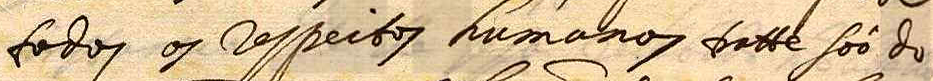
todos os Respeitos humanos tratte soô do
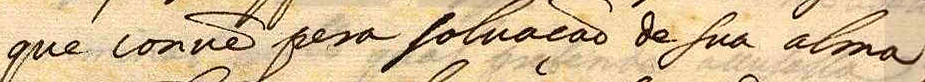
que conuē pera saluação de sua alma
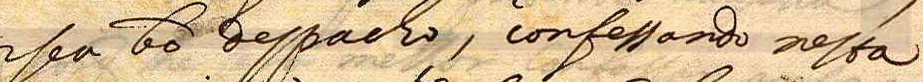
E seu bō despacho, confessando nesta
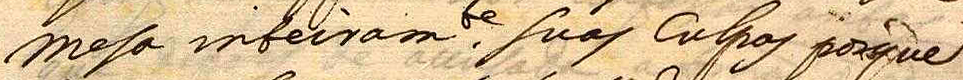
mesa inteiram.te suas culpas porque
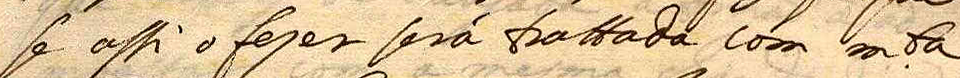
se assi o fezer será trattada com m.ta
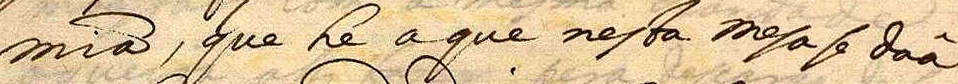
mīa, que he a que nesta mesa se daâ
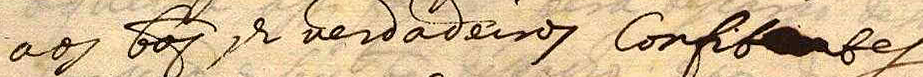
aos bōs, E uerdadeiros confit__tes,
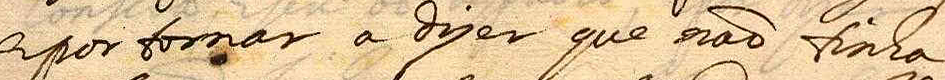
E por tornar a dizer que não tinha
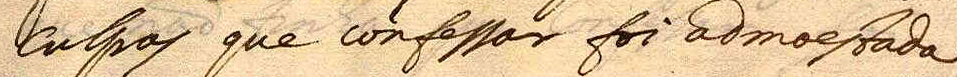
culpas que confessar foi admoestada
